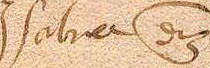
Jsabell d̄iz
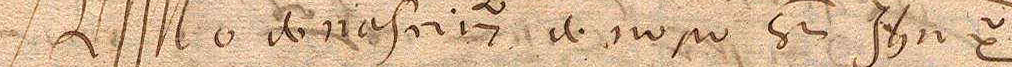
ANNo do nascimto de noso Sr̄ Jhū xo
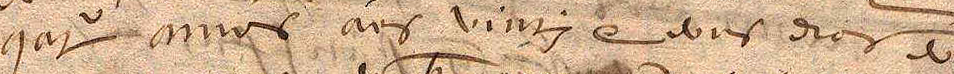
qato annos aos vinte e dous dias do
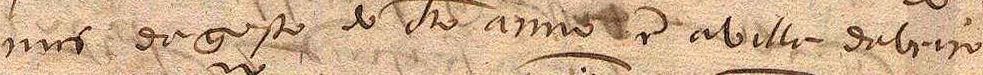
mes dagosto do d̄to anno ē a villa daveiro
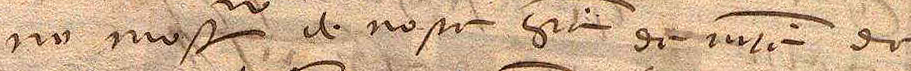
no mostro de nosa S̄ra da m̄ia da
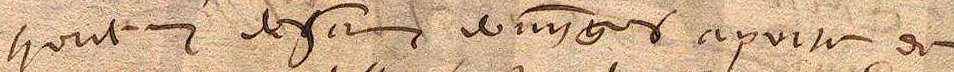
hordem de Sam dom̄jgos a porta da
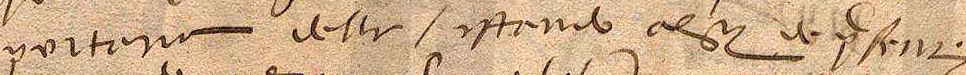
portaria dele / estando ahy de p̄sente
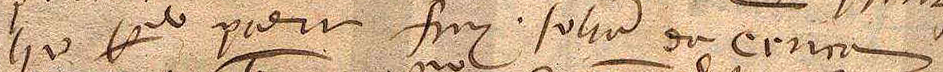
ho Rdo padre frey . Johā dacençam
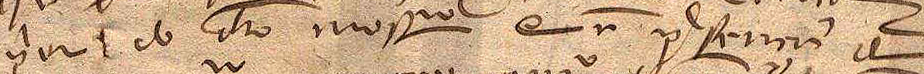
pior do d̄to mostro e ē p̄sença de
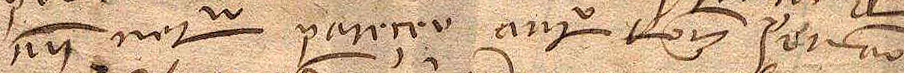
m̄j notro pareçeo anto Rōiz Jrmão
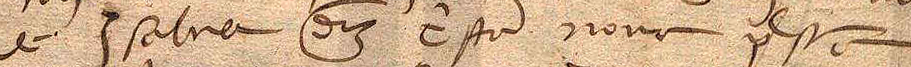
de Jsabell d̄iz cistā noua p̄ssa
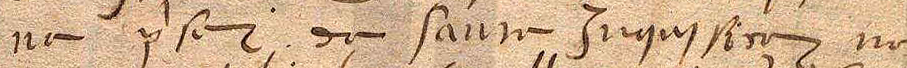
na pisam da santa Jnqujsiçam na
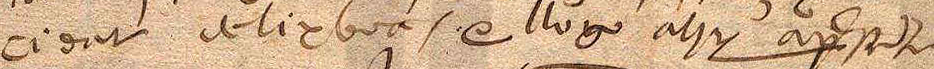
Cidade de lixboa / e llogo ahy ap̄sētou
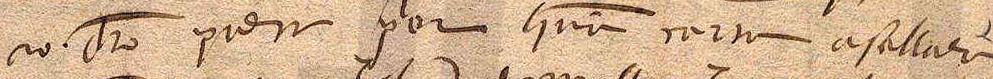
ao d̄to padre pior hūa carta asellada
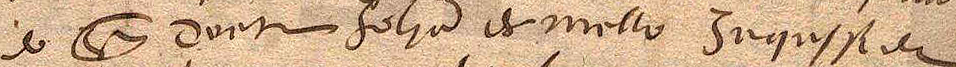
do S̄r doctor Johā de mello Jnqujsidor
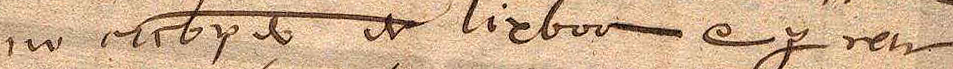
no arc̄bpdo de lixboa e ꝑ elle
